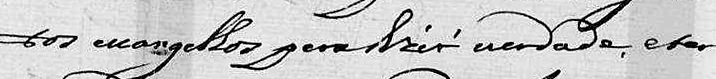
tos euangelhos pera dizer uerdade, e ter
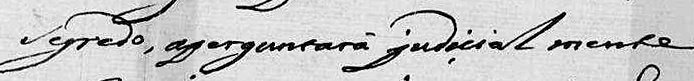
segredo, a perguntará judicialmente
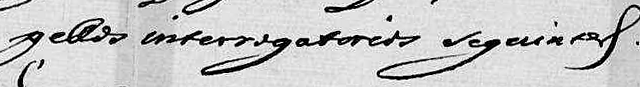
pellos interrogatorios seguintes.
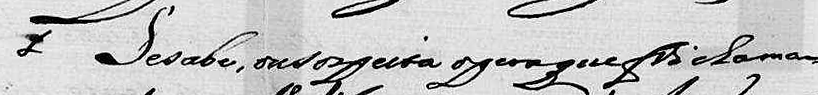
1 Se sabe, ou sospeita o pera que foi chama
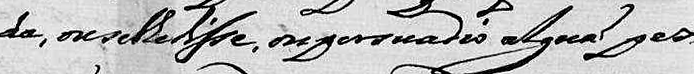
da, ou se lhe disse, ou persuadio alguā pes
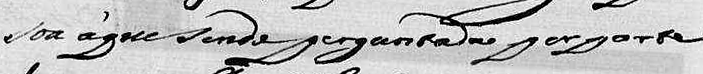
soa a que sendo perguntada por parte
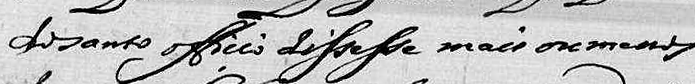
do santo officio dissesse mais ou menos
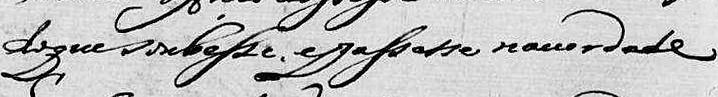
do que soubesse, e passasse na uerdade
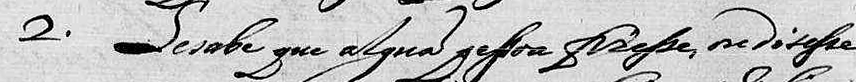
2. Se sabe que alguā pessoa fizesse, ou disesse
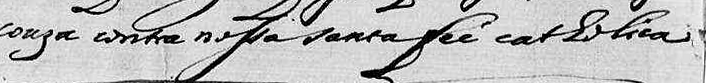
couza contra nossa santa feé catholica
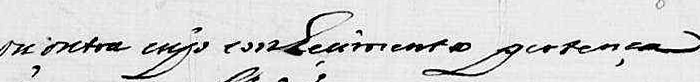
ou outra cujo conhecimento pertença
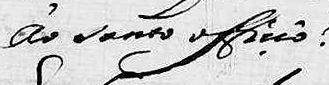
ao santo officio?
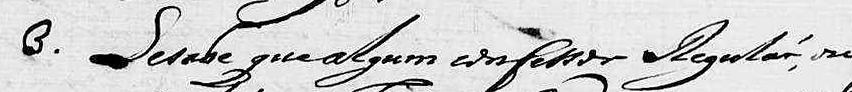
3. Se sabe que algum confessor Regular, ou
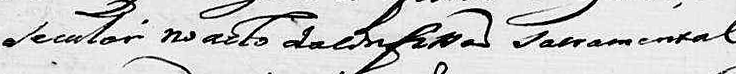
secular no acto da confissaõ sacramental
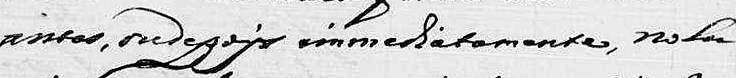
antes, ou depois immediatamente, no Lu
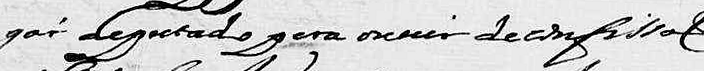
gar deputado pera ouuir de confissaõ
